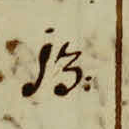13:
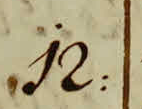12:
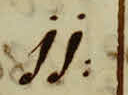11:
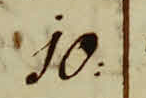10:
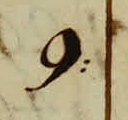9:
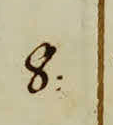8:
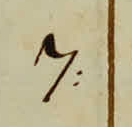7:
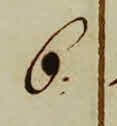6:
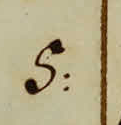5:
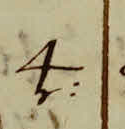4:
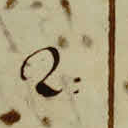2:
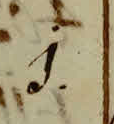1.
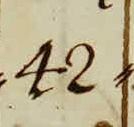42
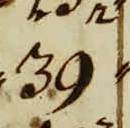39
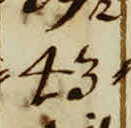43
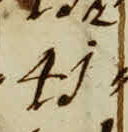41
